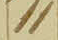11
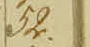52.
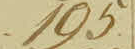195.
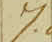7.
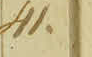41.
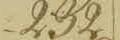232
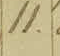11.
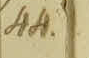44.
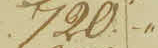720.
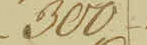300
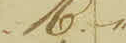16.
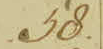58.
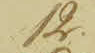12.
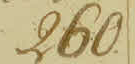260.
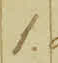1.
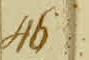46
